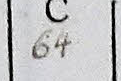64
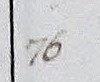76
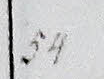54
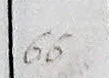66
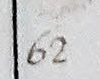62
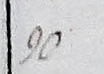90
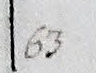63
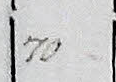70
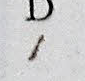1
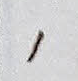1
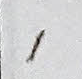1
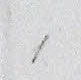1
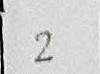2
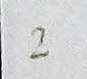2
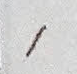1
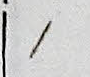1
